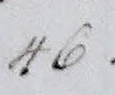46
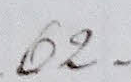62
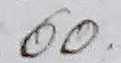60
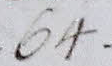64
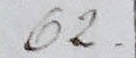62
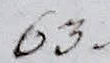63
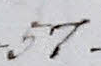57
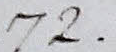72
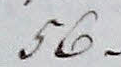56
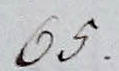65
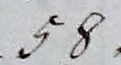58
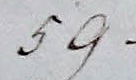59
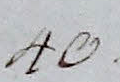40
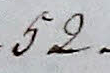52
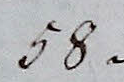58
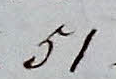51
